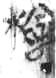檐（擔）
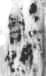○（巂）
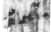二
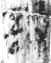敔
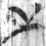之
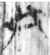四
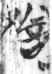檐（擔）
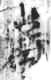○（巂）
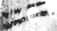二
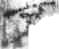五
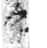來
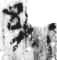敔
